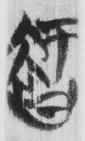智
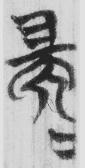耑=
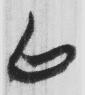㠯（以）
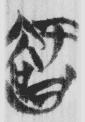智
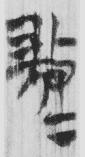𡵂攴=
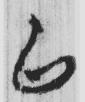㠯（以）
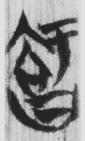智
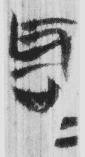台B=
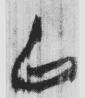㠯（以）
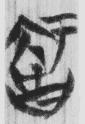智
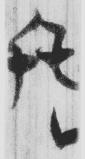夂
